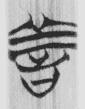善
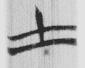士
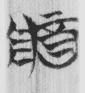𨟻
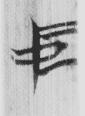𠁩
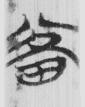{田八斗}
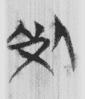死
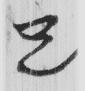巳
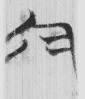今
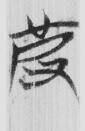皮
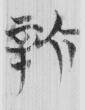{辛斤}
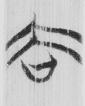去
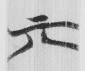亓
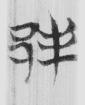邦
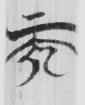而
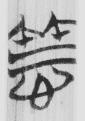{竹二心}
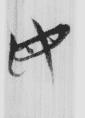母
